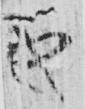女（如）
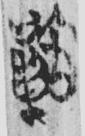○（鮑）
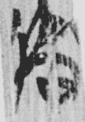○（叔）
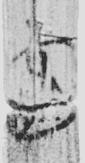○（牙）
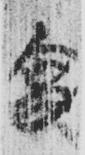○（答）
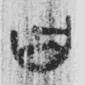曰
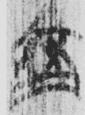齊
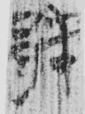邦
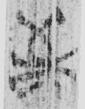至
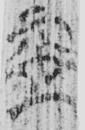亞（惡）
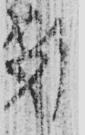死
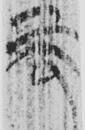而
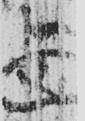○（尚）
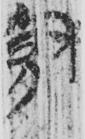穆
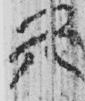亓（其）
